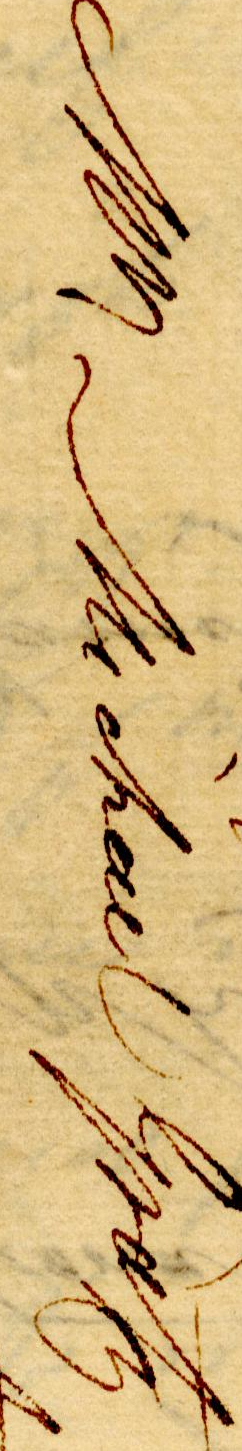M^r Michael Gratz
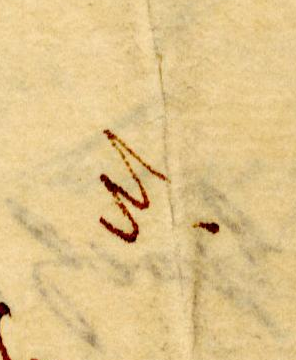in
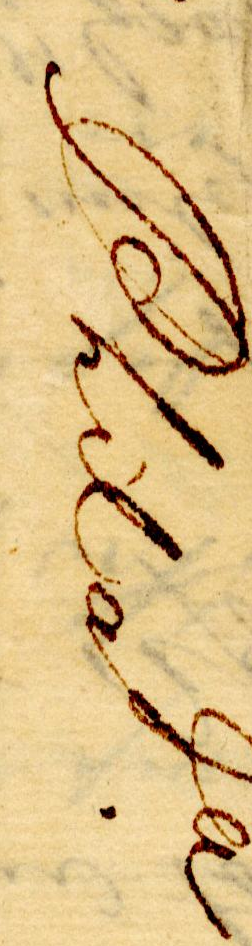Phila^da.
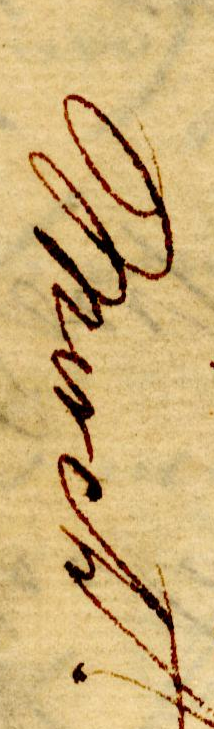Merch^t.
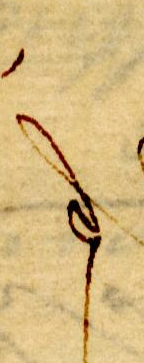To
